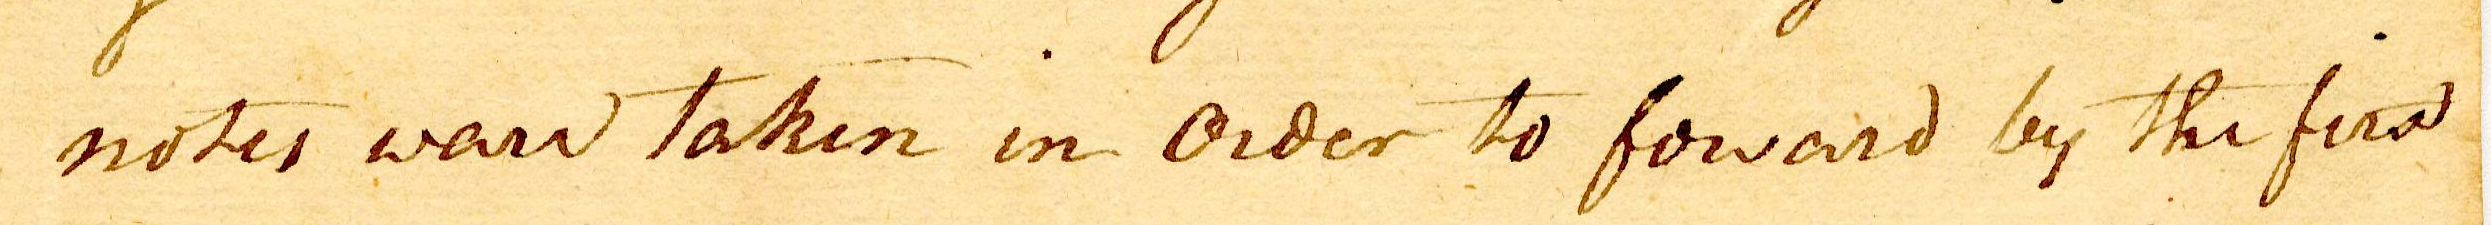notes ware taken in order to forward by the first
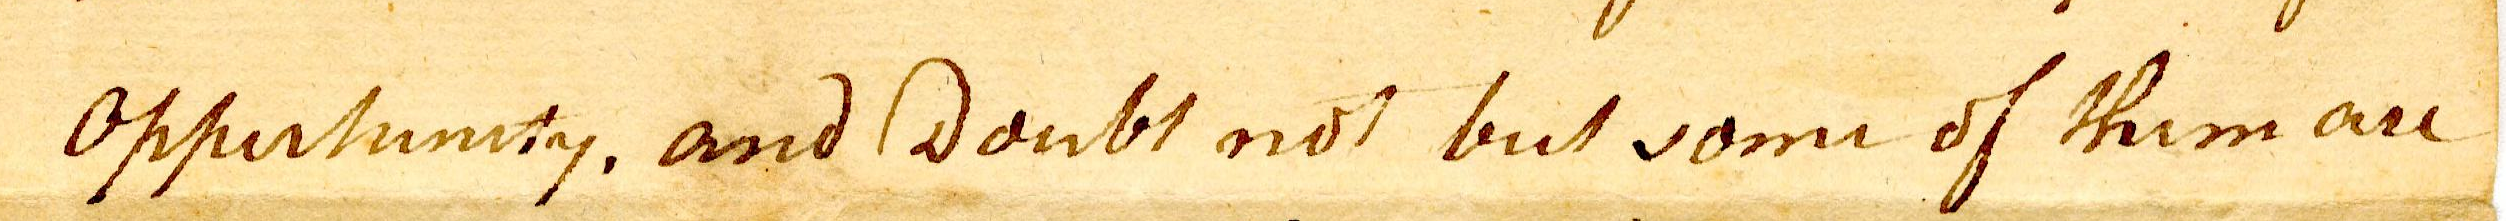Oppertunity, and doubt not but some of them are
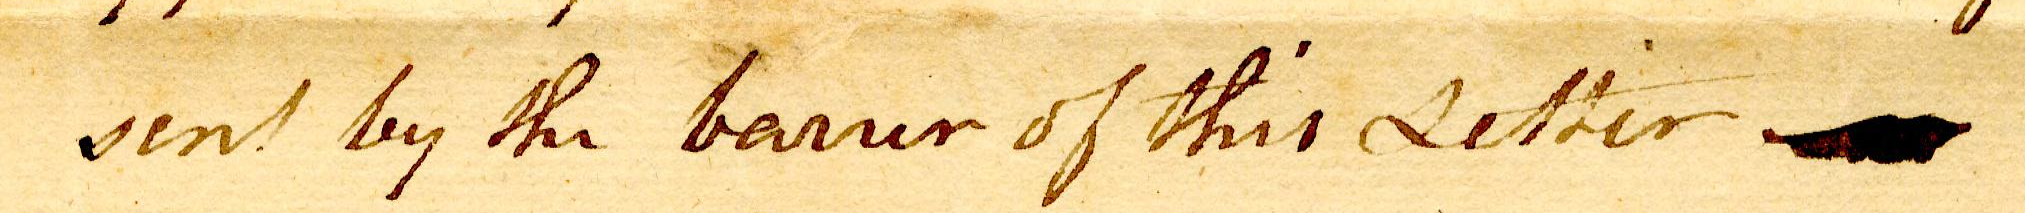sent by the barrer of this Letter-
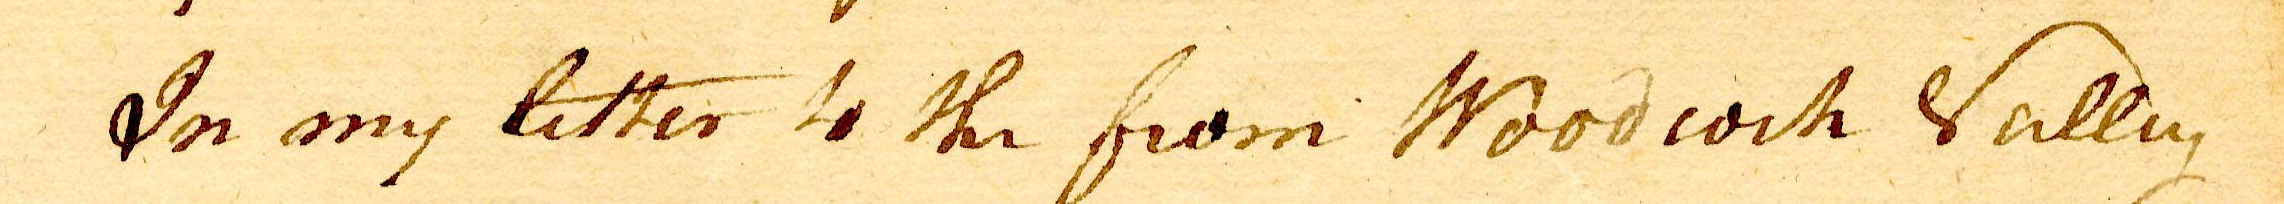In my letter to the from Woodcock Valley
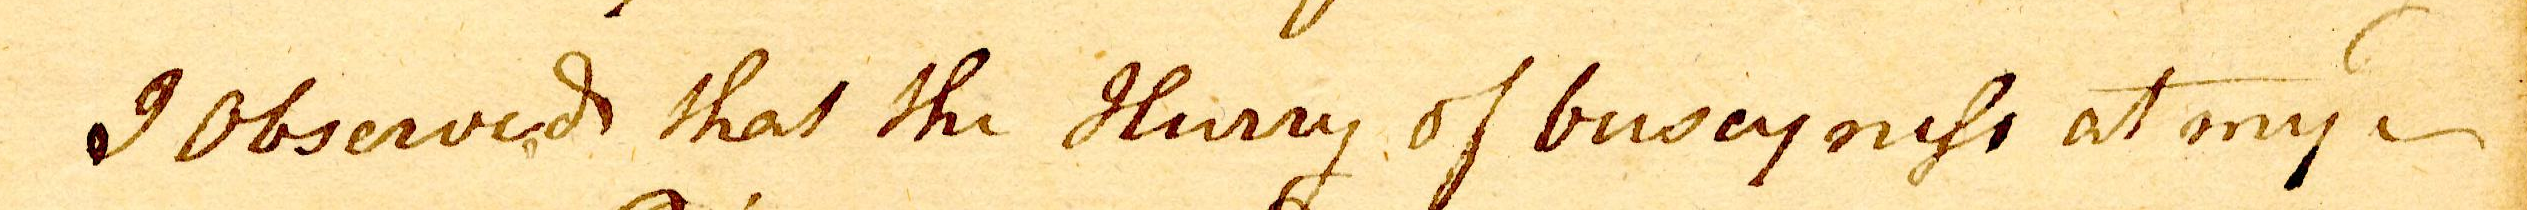I Observed that the Hurry of buseyness at my
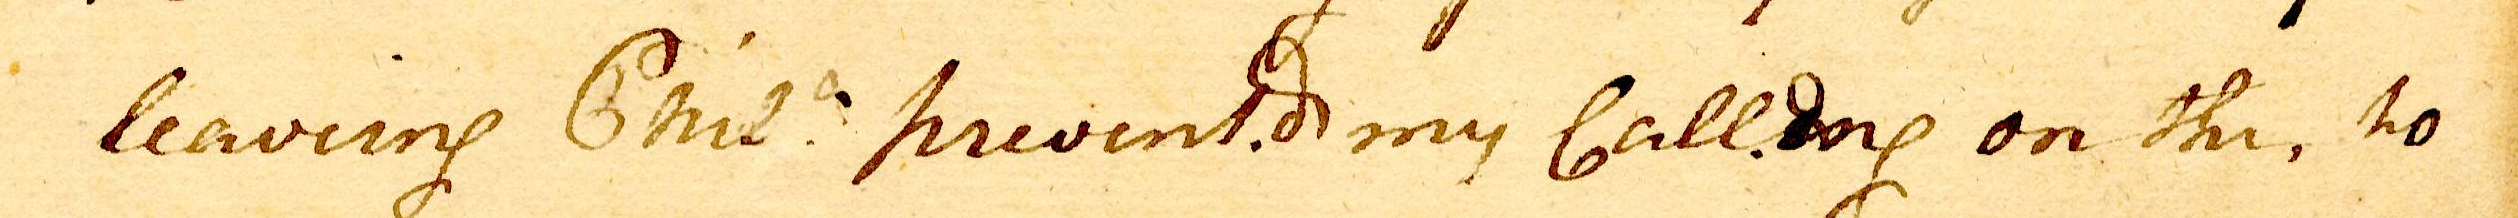leaving Phil^a. prevent'd my Calling on the, to
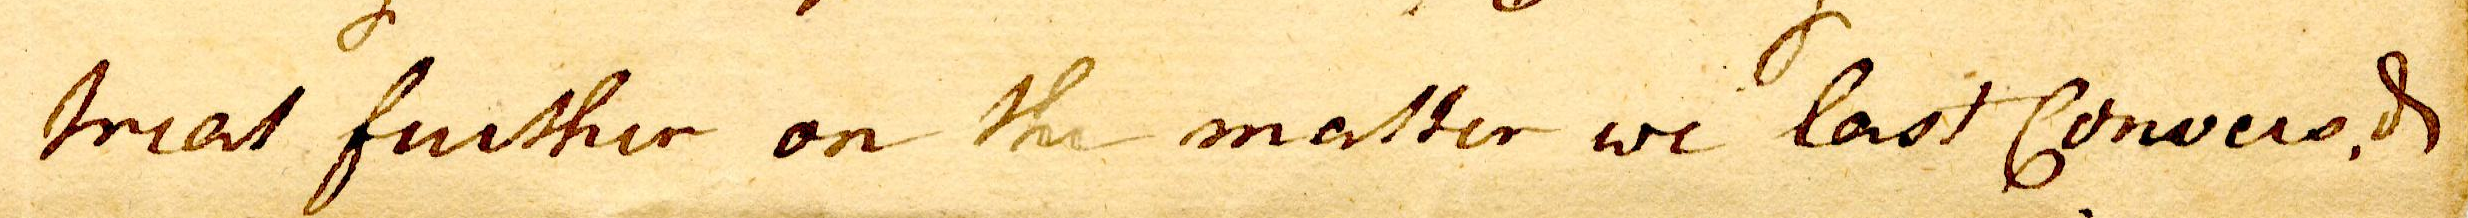treat further on the matter we last Convers'd
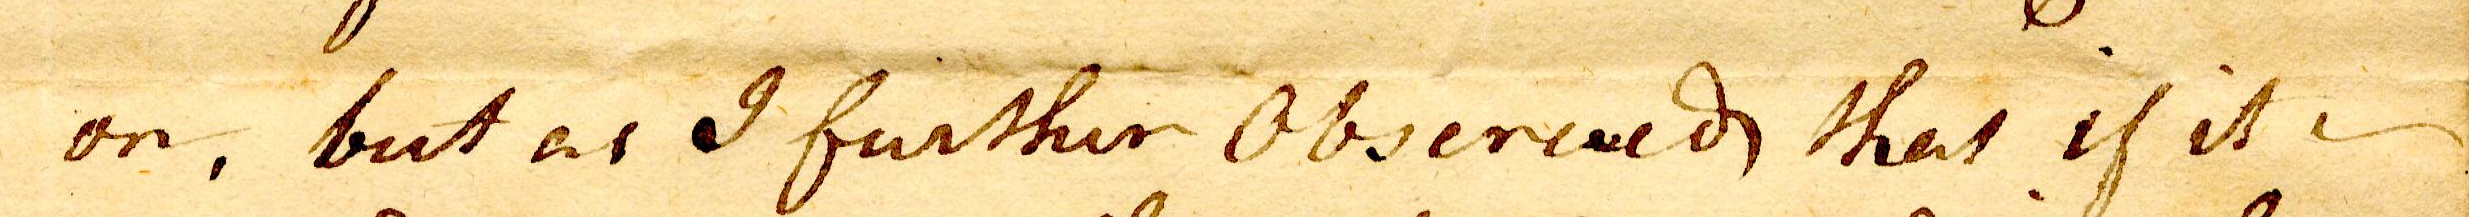on, but as I further Observed that if it
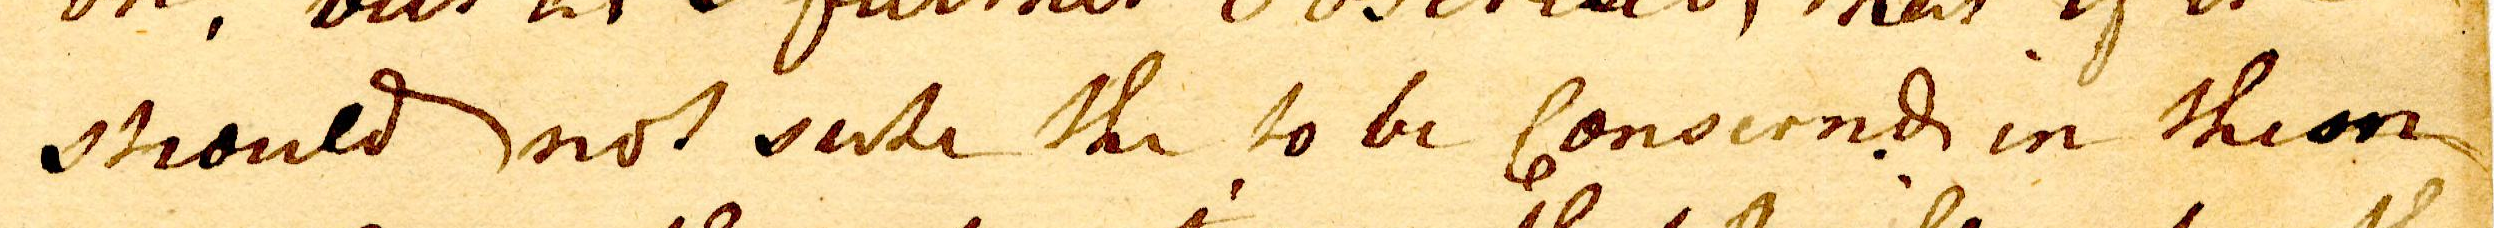should not sute the to be Consern'd in them
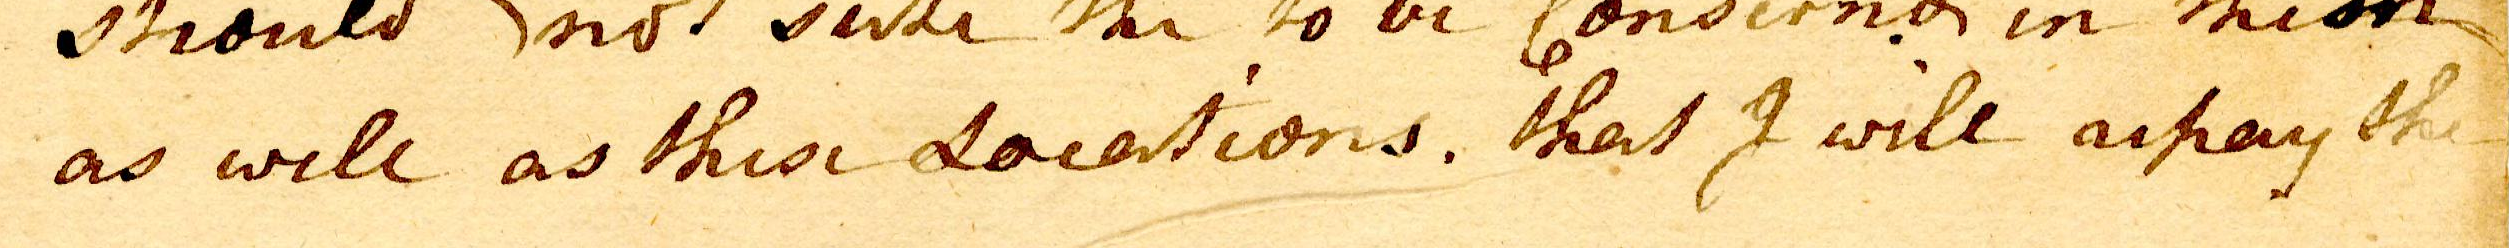as well as these Locations. that I will repay the
